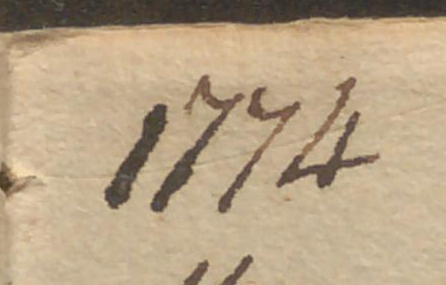1774
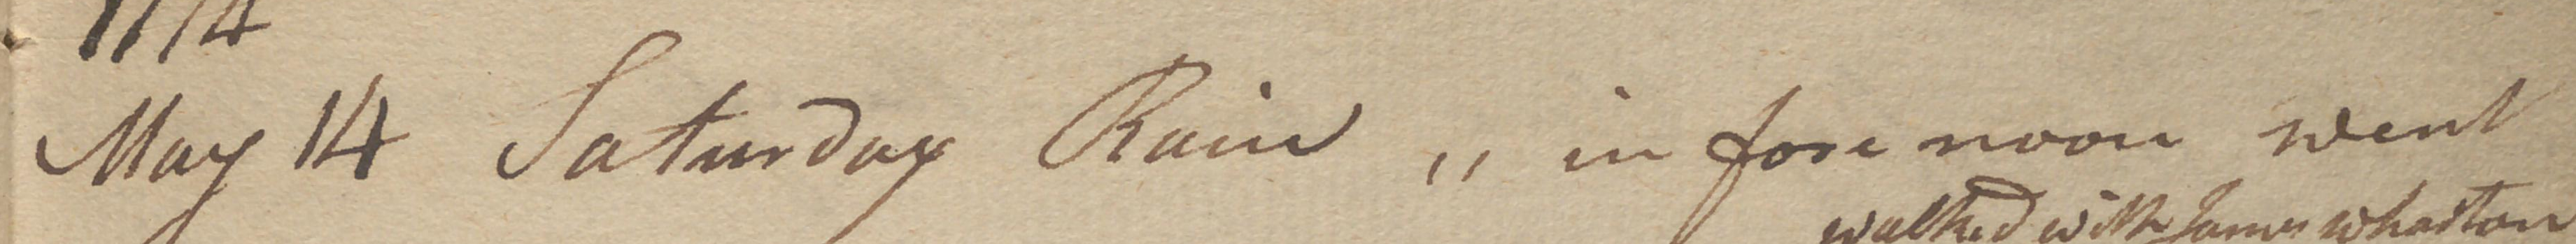May 14 Saturday Rain, in fore noon went
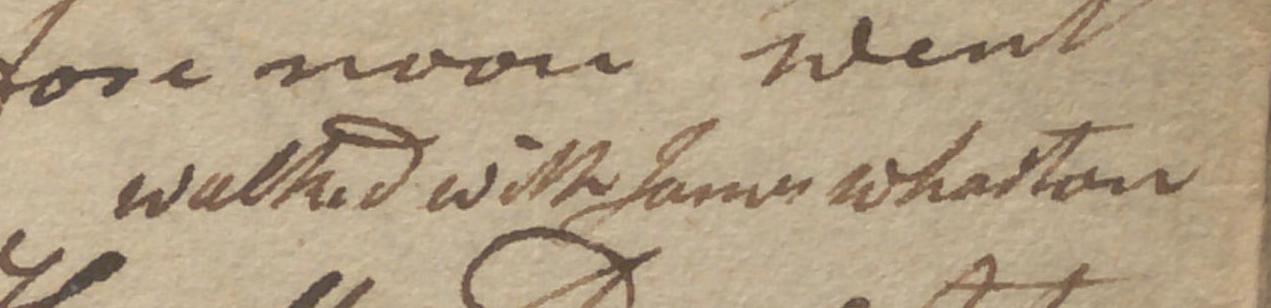walked with James wharton
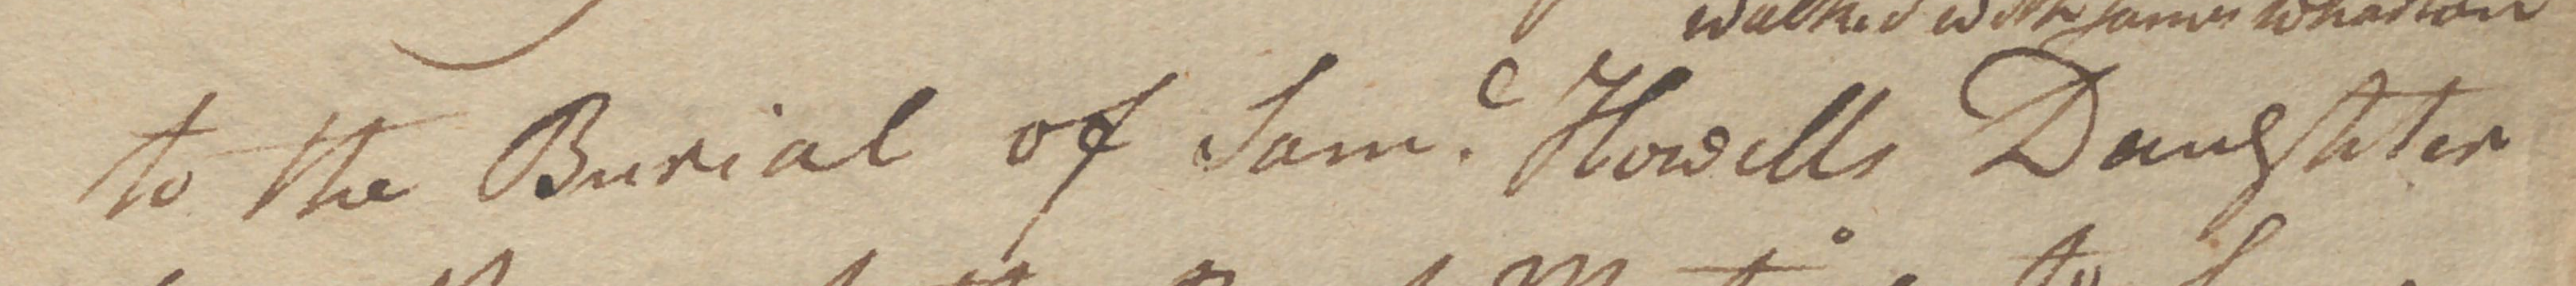to the Burial of Sam^l. Howells Daughter
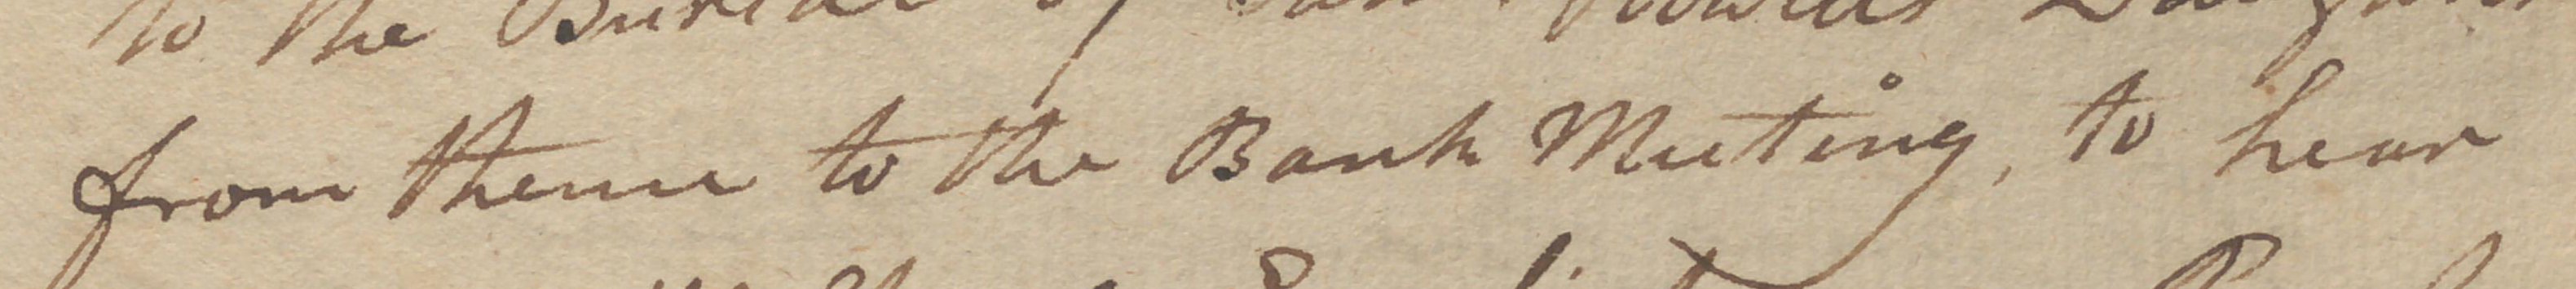from thence to the Bank Meeting to hear
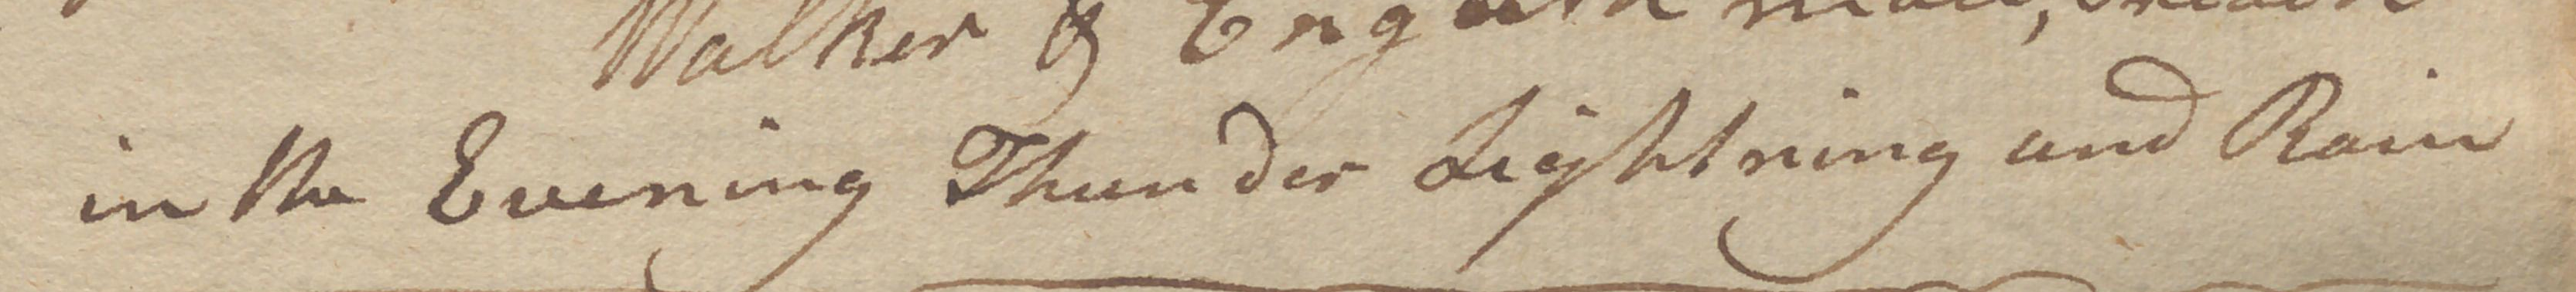in the Evening Thunder Lightning and Rain
